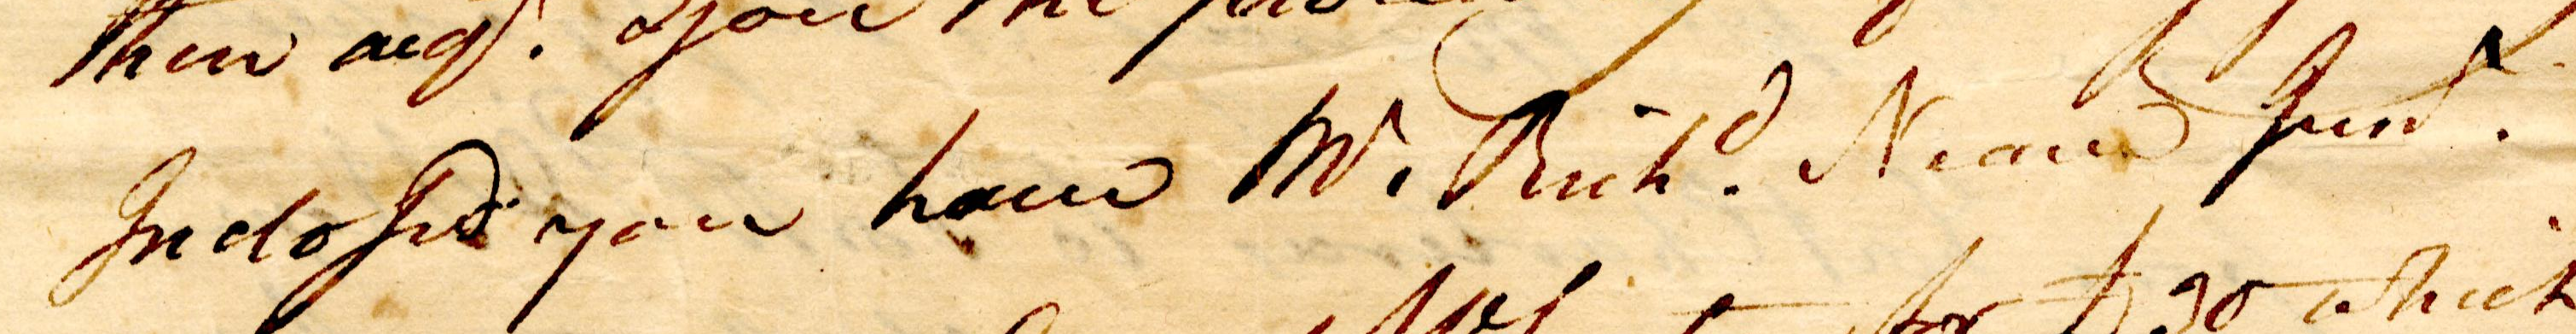Inclosed you have M^r. Rich^d. Neare Jun^r.
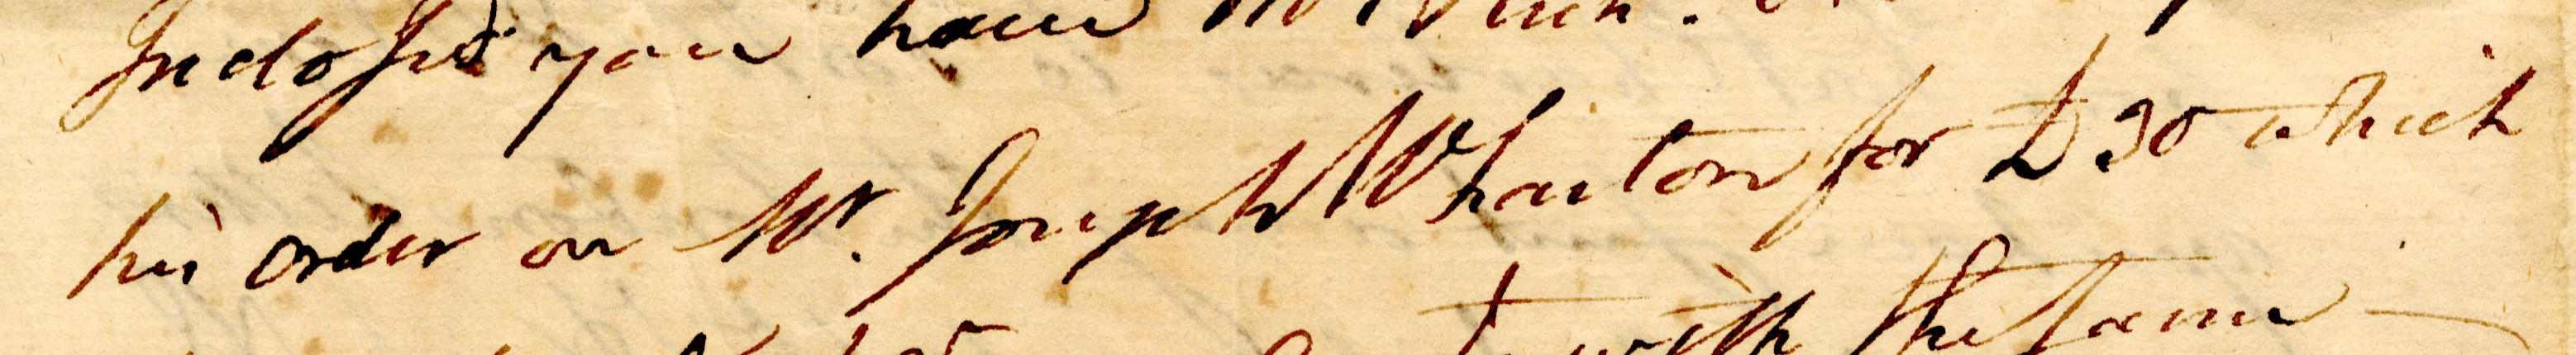his order on M^r Joseph Wharton for £30 which
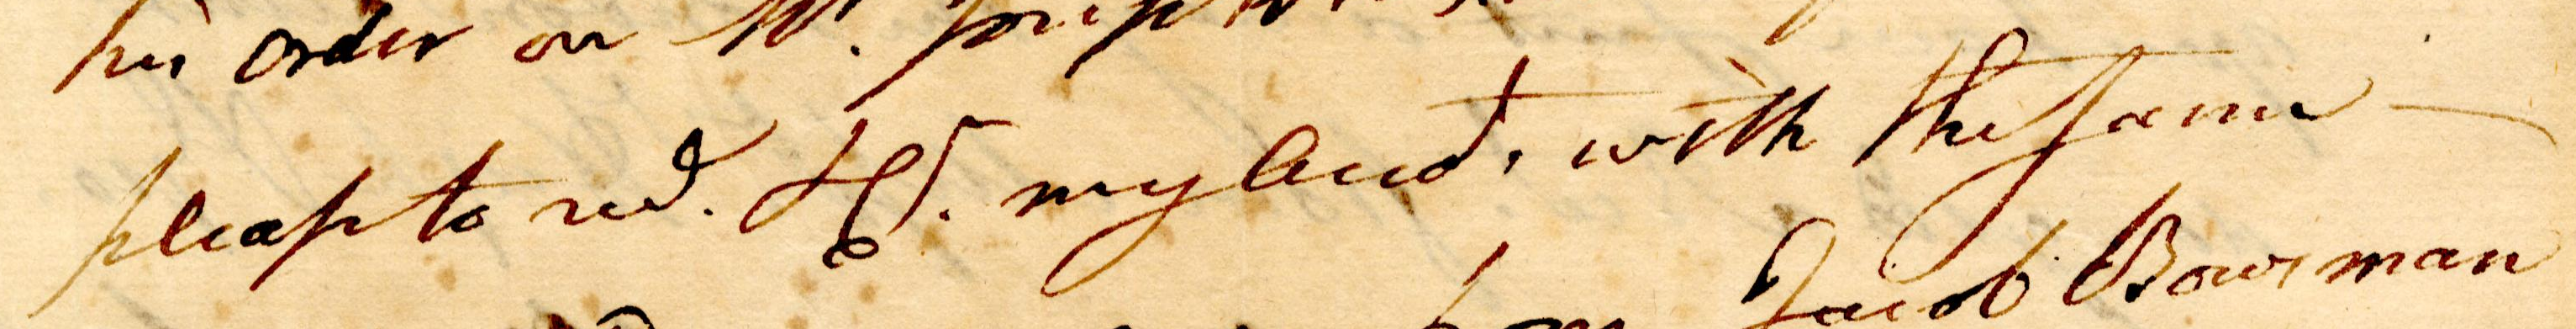please to rec^d. &C. my Acco^t with the same-
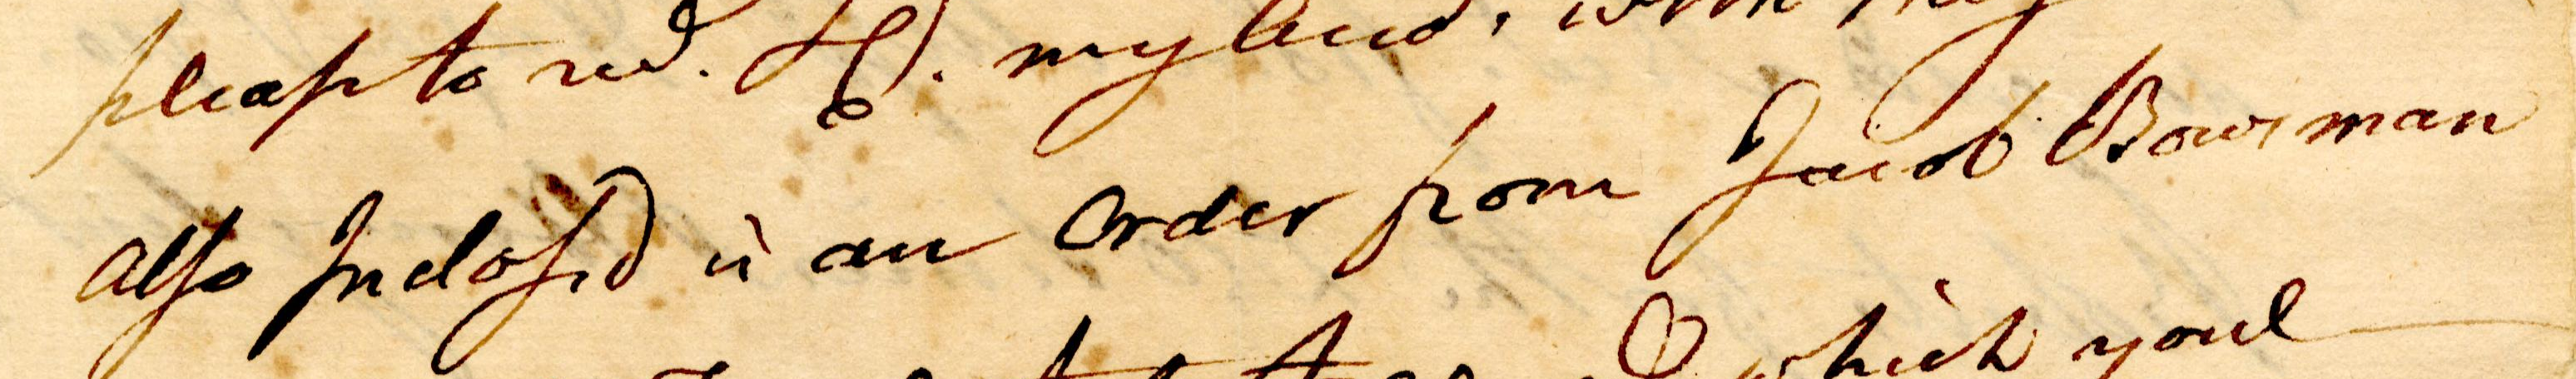also Inclosd is an order from Jacob Bowman
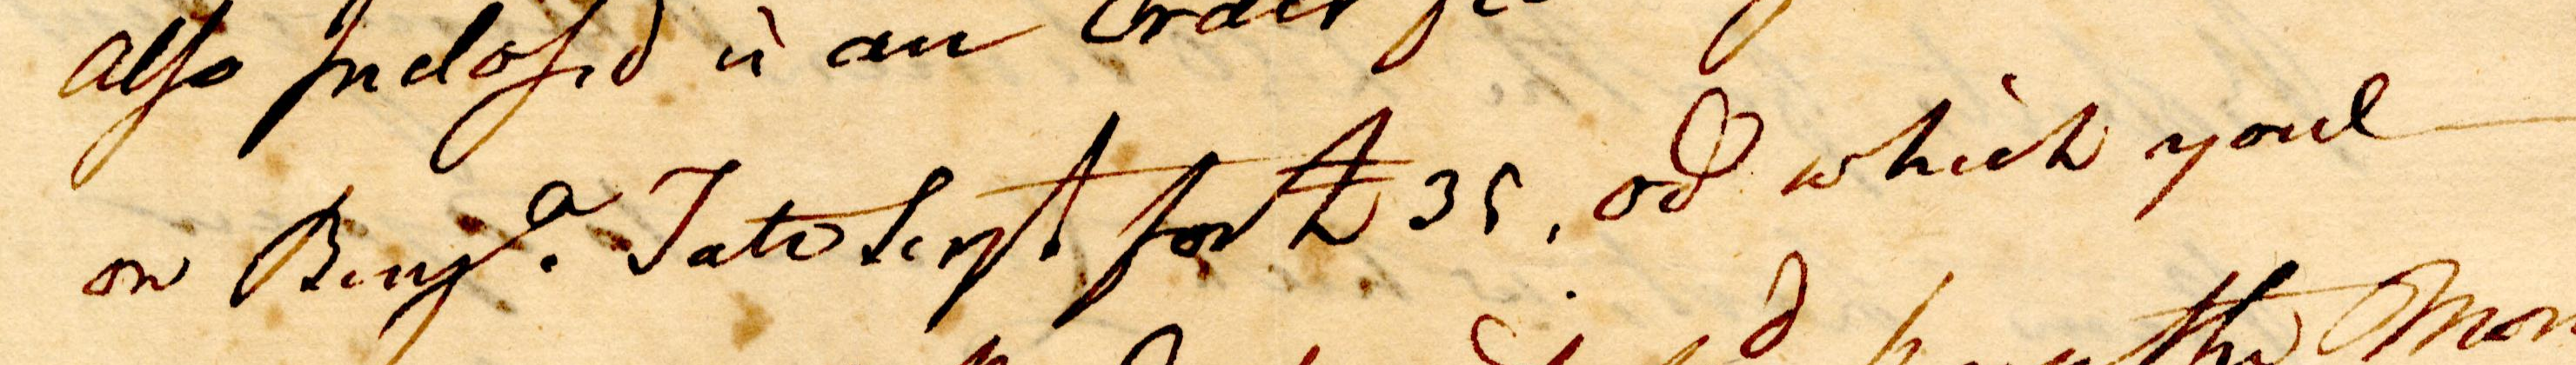on Benj^.a Tate Sent for £35, od which youl
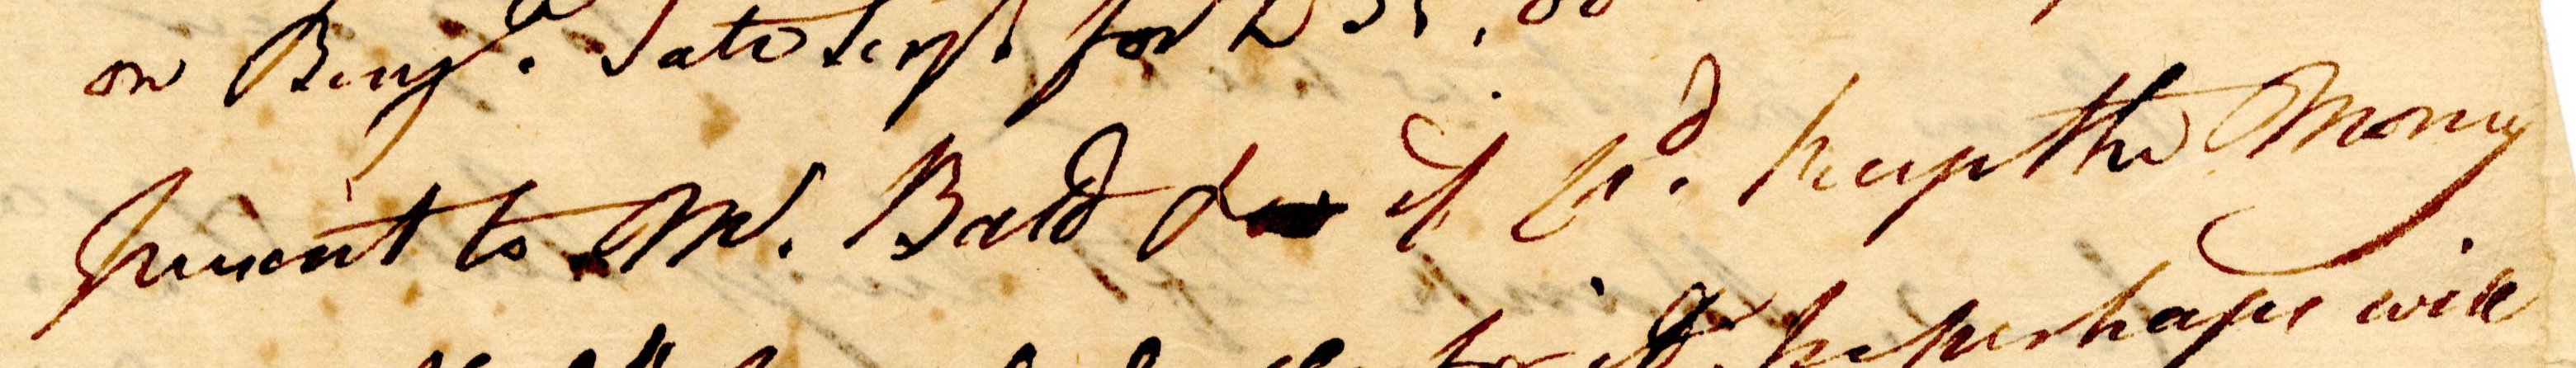present to M^. Bert & if Cr^d. keep the Money
